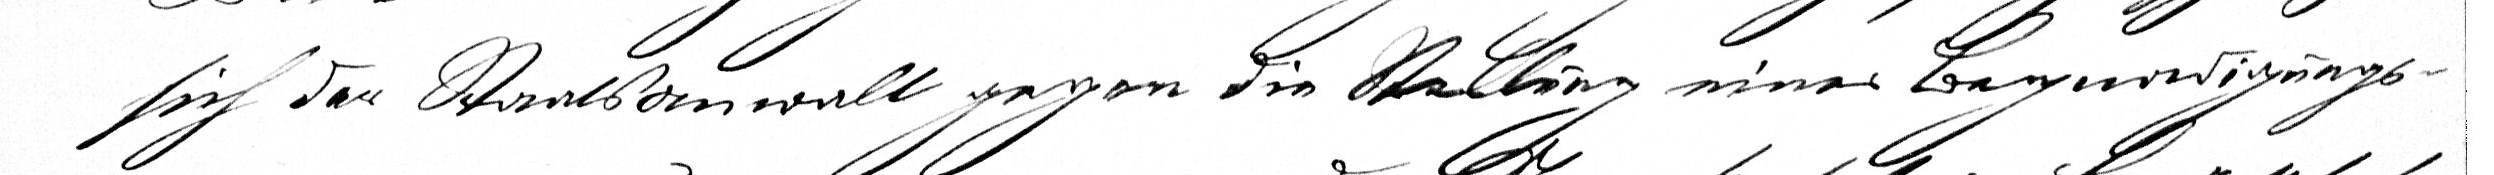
sich der Staatsanwalt gegen die Stellung eines Begnadigungs¬
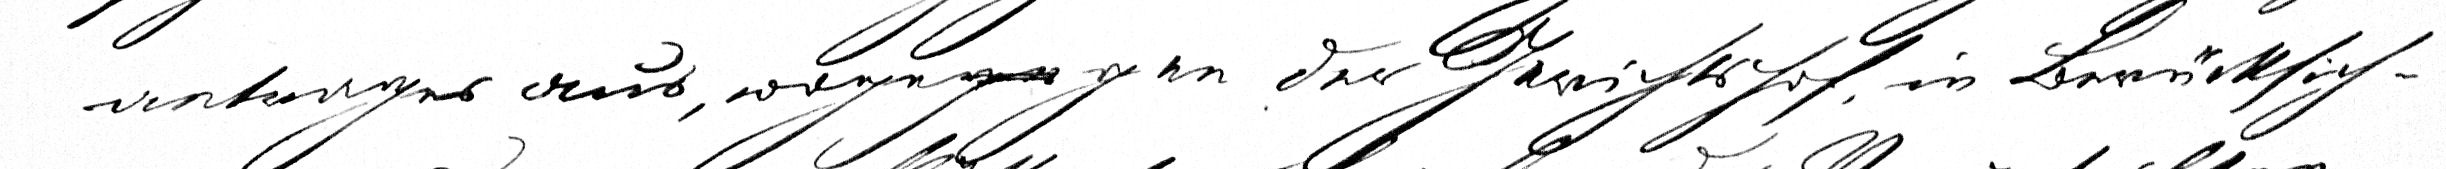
antrages aus, wogegen der Gerichtshof, in Berücksich¬
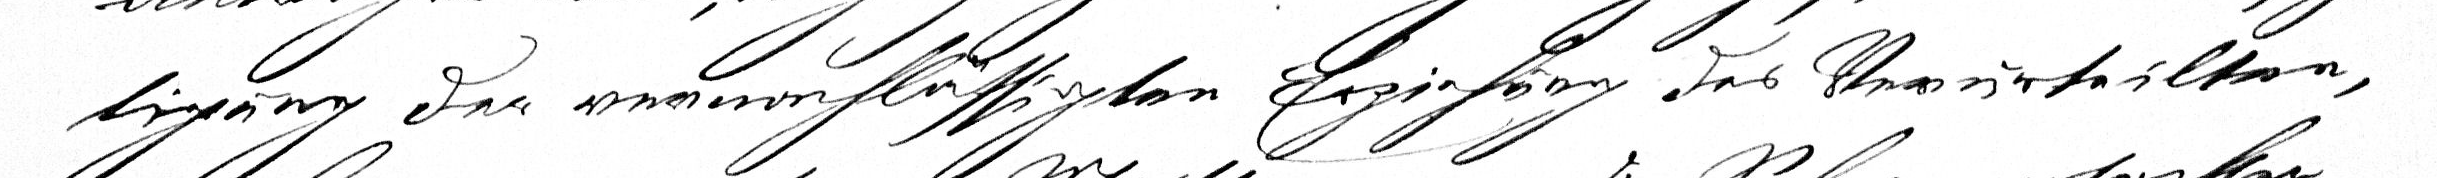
tigung der vernachlässigten Erziehung des Verurteilten,
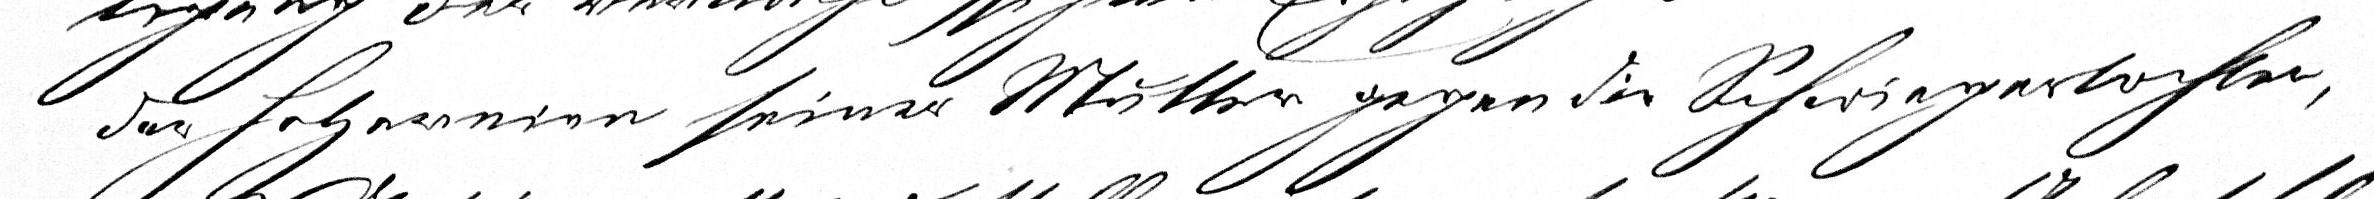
der Hetzereien seiner Mutter gegen die Schwiegertochter,
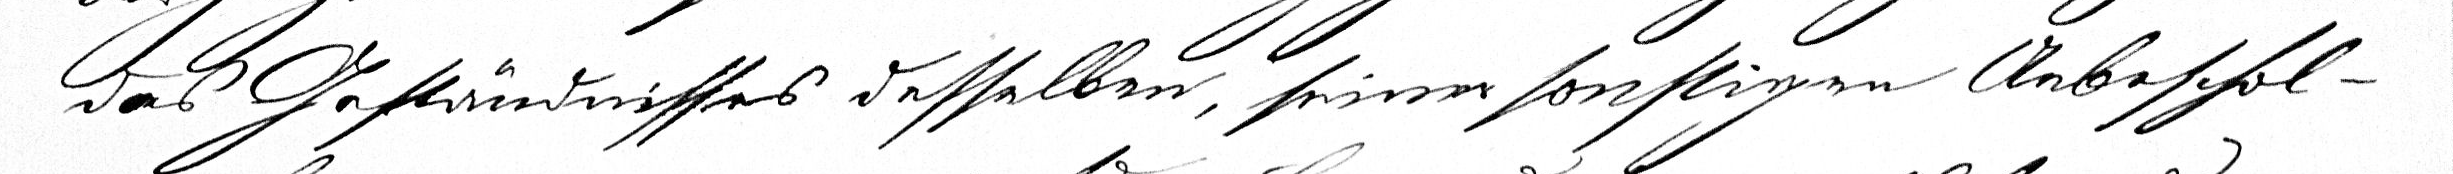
das Geständnisses desselben, seiner sonstigen Unbeschol¬
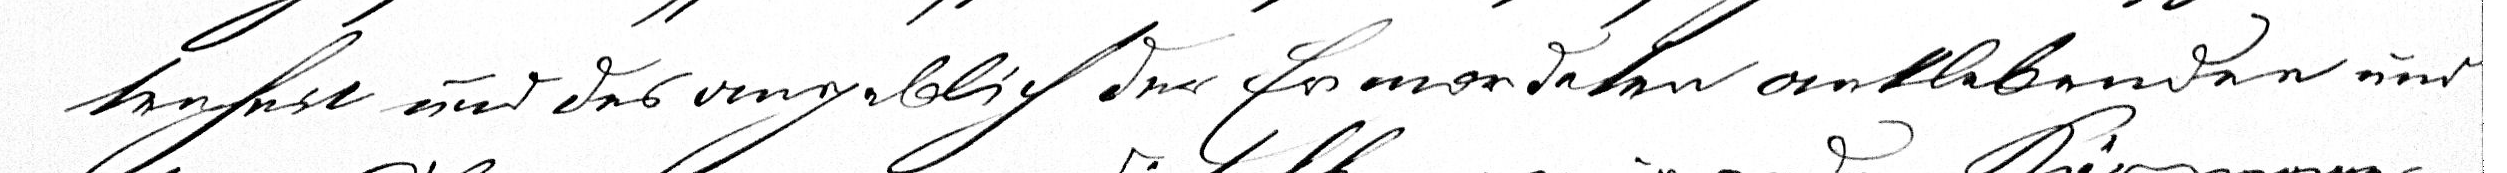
tenheit und des angeblich der Ermordeten anklebenden und
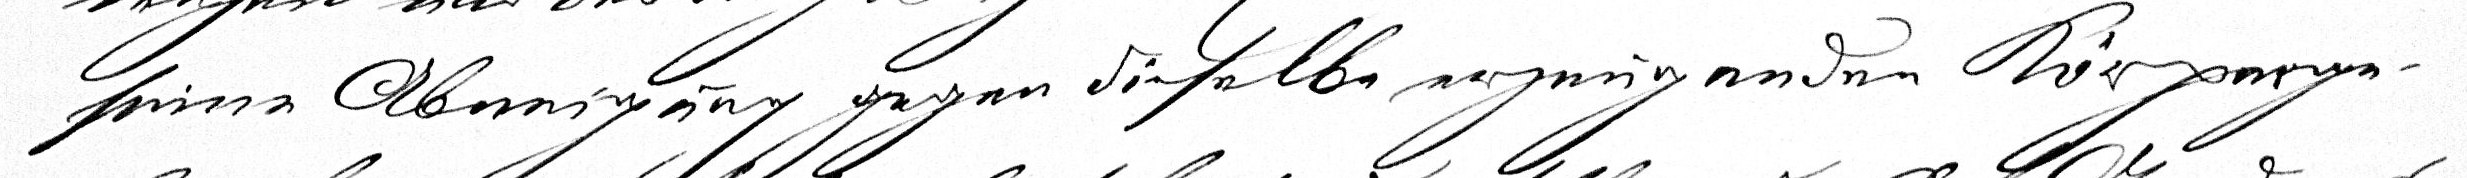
seine Abneigung gegen dieselbe erzeugenden Körperge¬
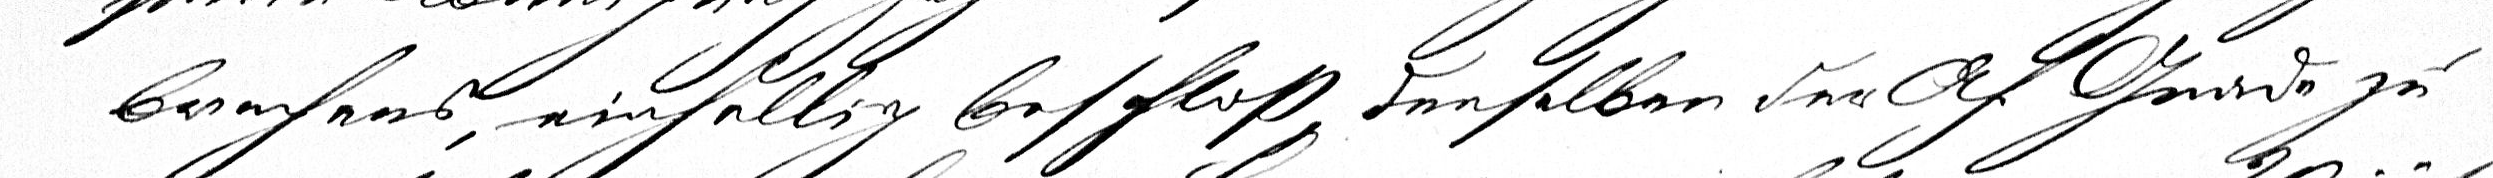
brechens, einhellig beschloß, denselben der Af Gnade zu
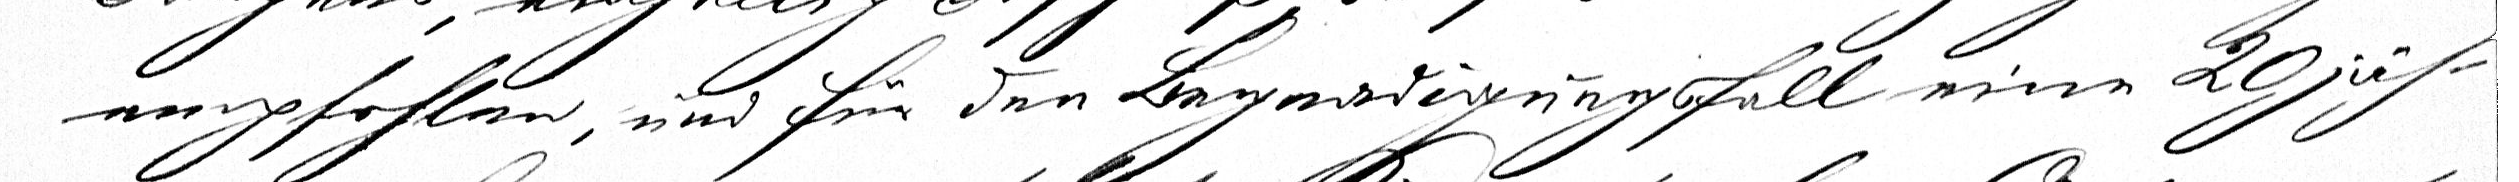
empfehlen, und für den Begnadigungsfall eine 20jäh¬
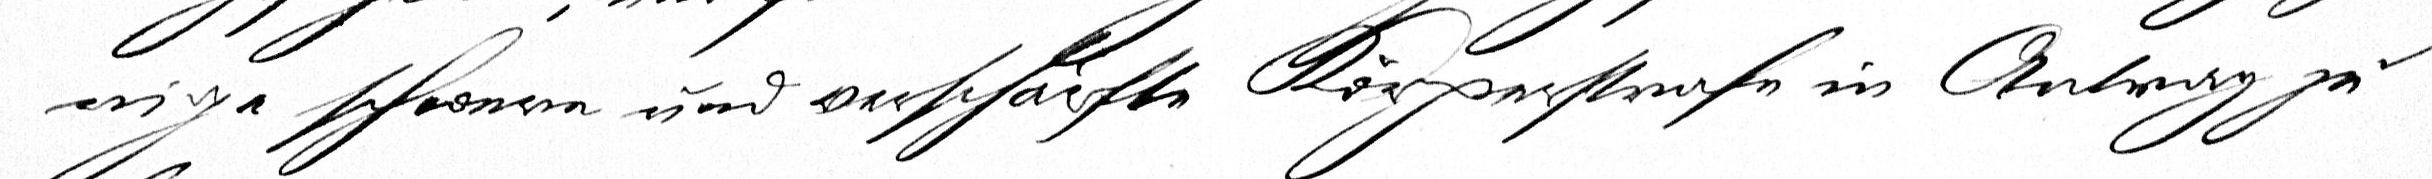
rige schwere und verschärfte Körperstrafe in Antrag zu
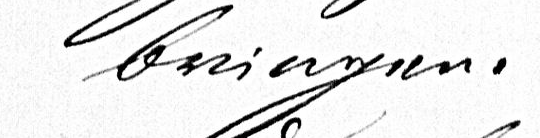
bringen.
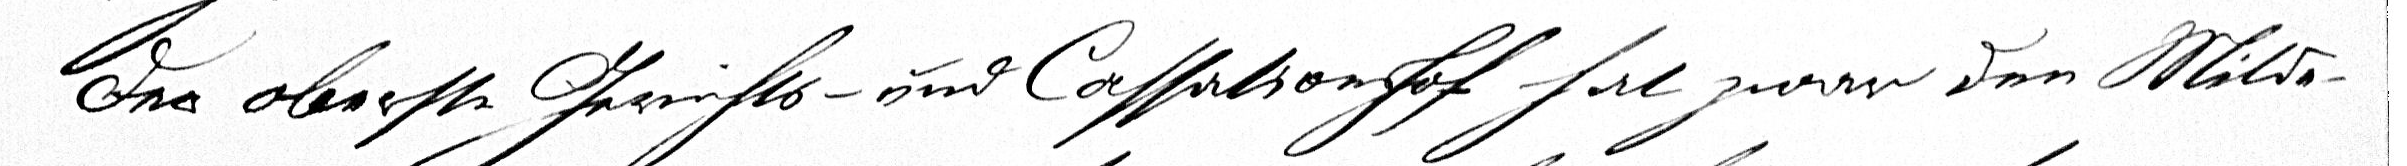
Der oberste Gerichts- und Cassationhof hat zwar den Milde¬
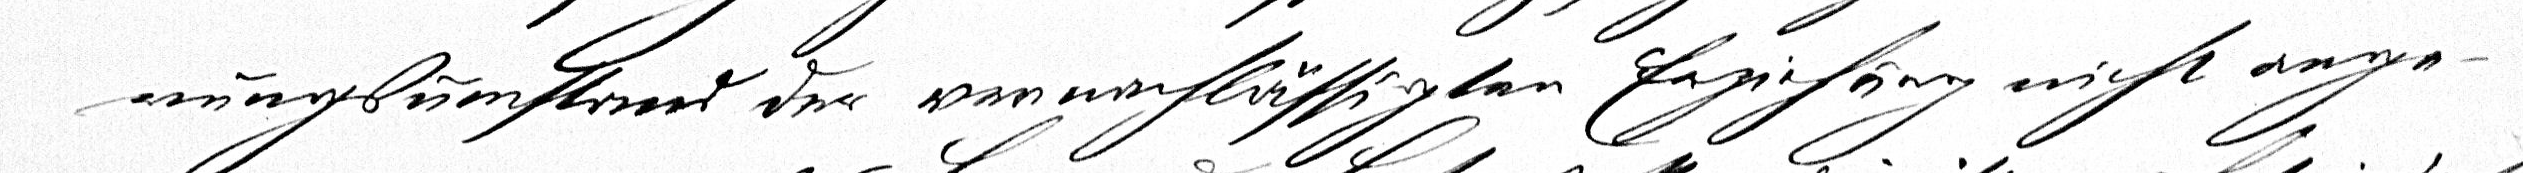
rungsumstand der vernachlässigten Erziehung nicht ange¬
